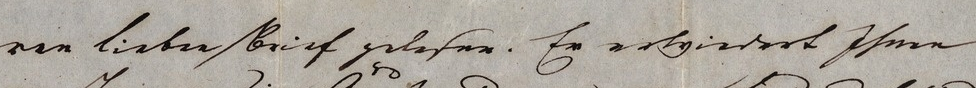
ren lieben Brief gelesen. Er erwiedert Ihnen
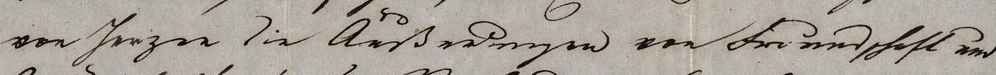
von Herzen die Äußerungen von Freundschaft und
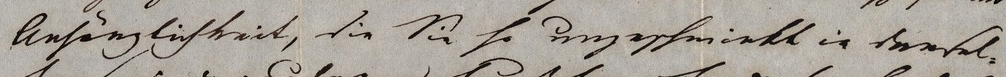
Anhänglichkeit, die Sie so ungeschminkt in densel-
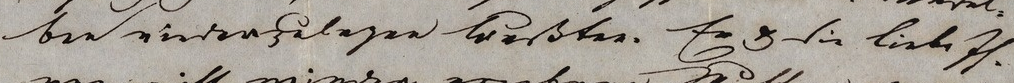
ben niederzulegen wußten. Er & die liebe Ih-
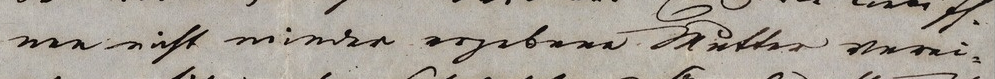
nen nicht minder ergebene Mutter verei-
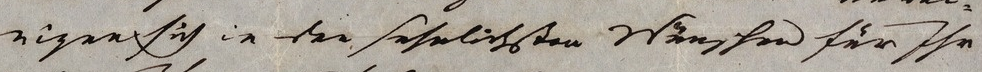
nigen sich in den sehnlichsten Wünschen für Ihr
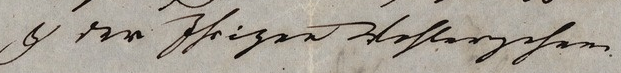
& der Ihrigen Wohlergehen.
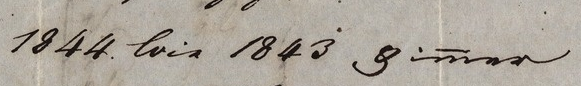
1844. wie 1843 & immer
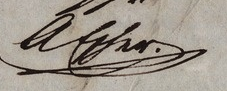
A Escher.
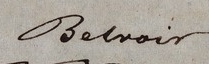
Belvoir
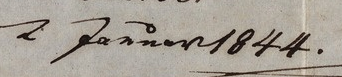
2 Januar 1844.
